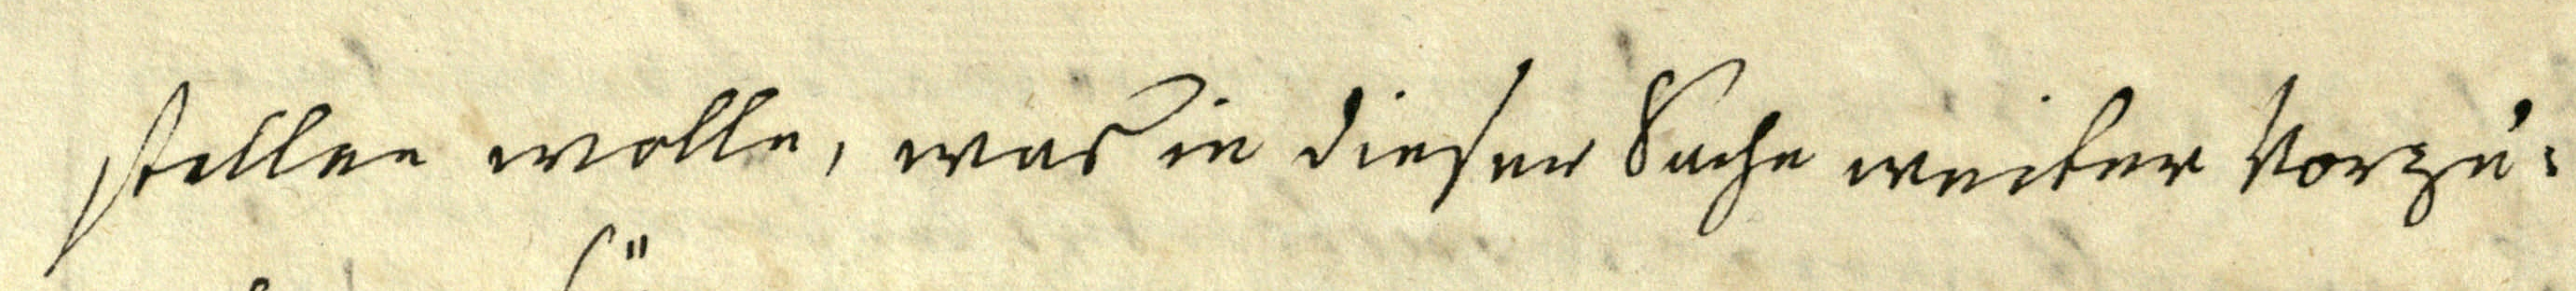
stellen wolle, was in dieser Sache weiter Vorzu¬
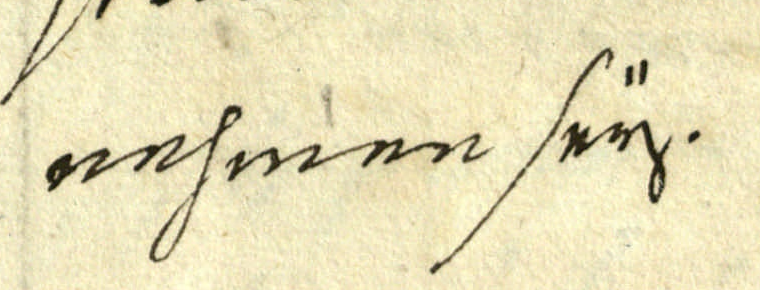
nehmen seÿ.
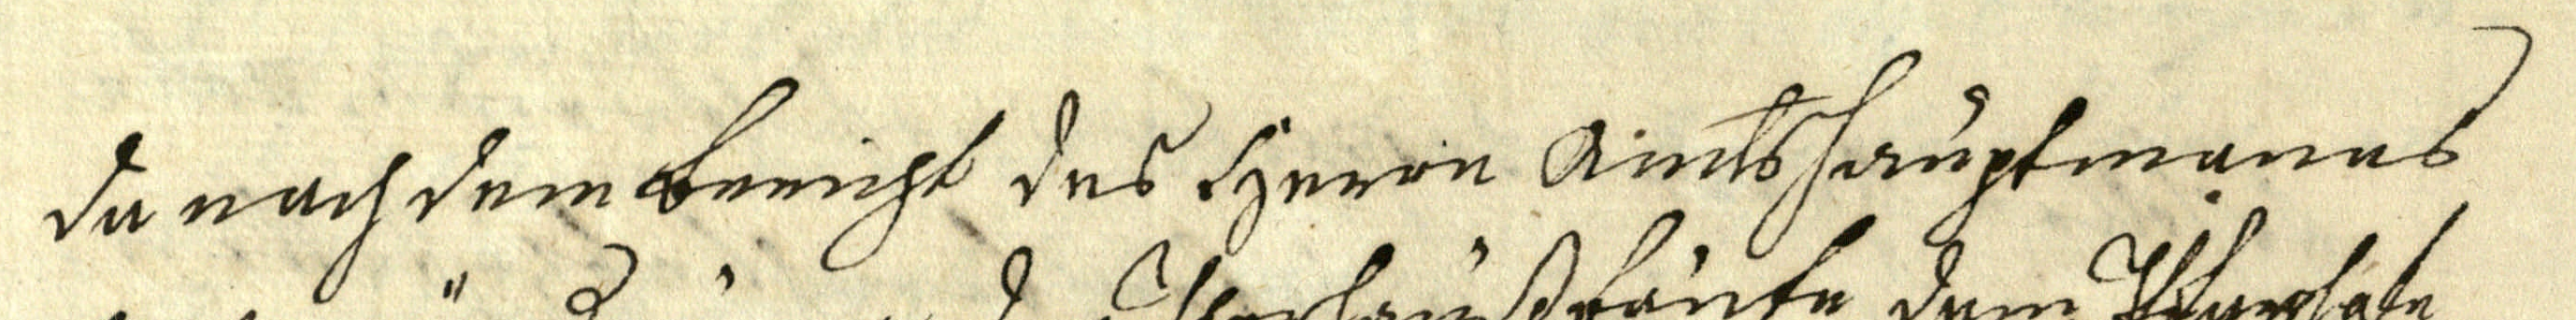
Da nach dem Bericht des Herrn Amtshauptmanns
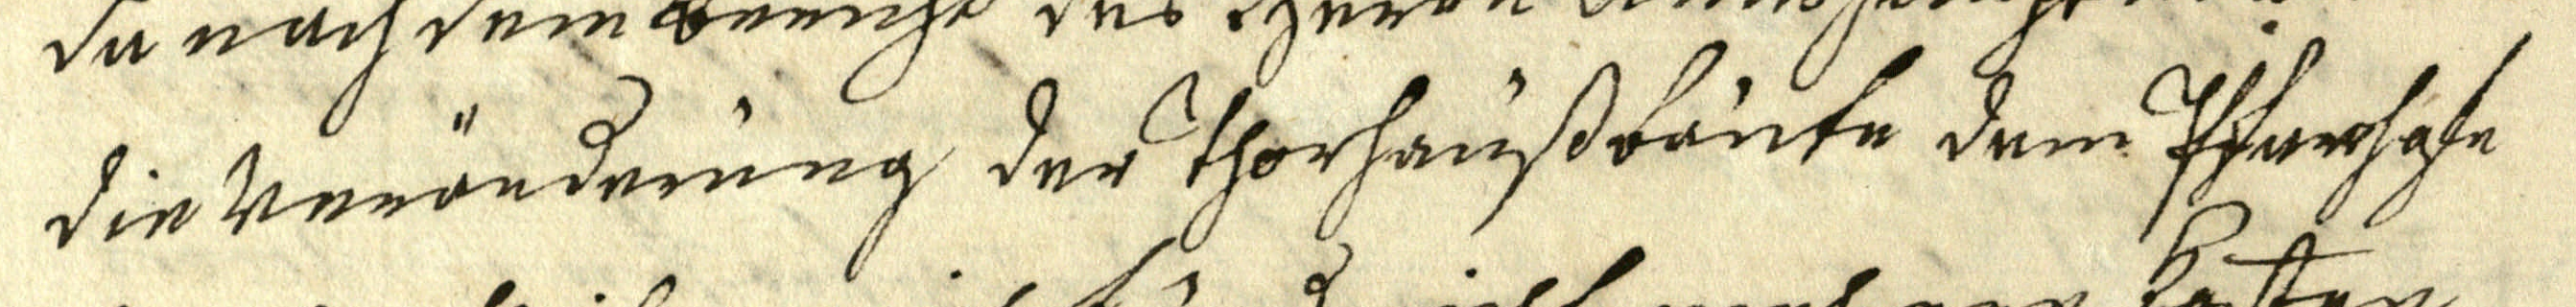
die Veränderung der Thorhaußbaute dem Pfarrhofe
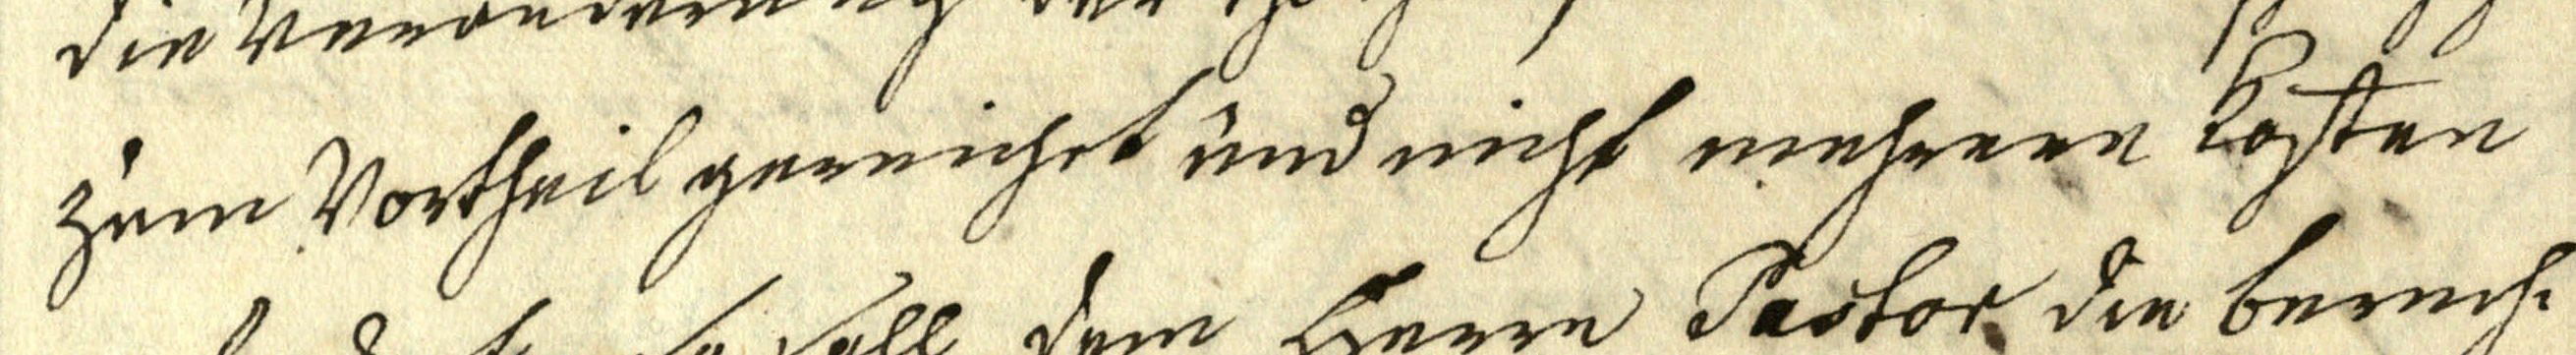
zum Vortheil gereichet und nicht mehrere Kosten
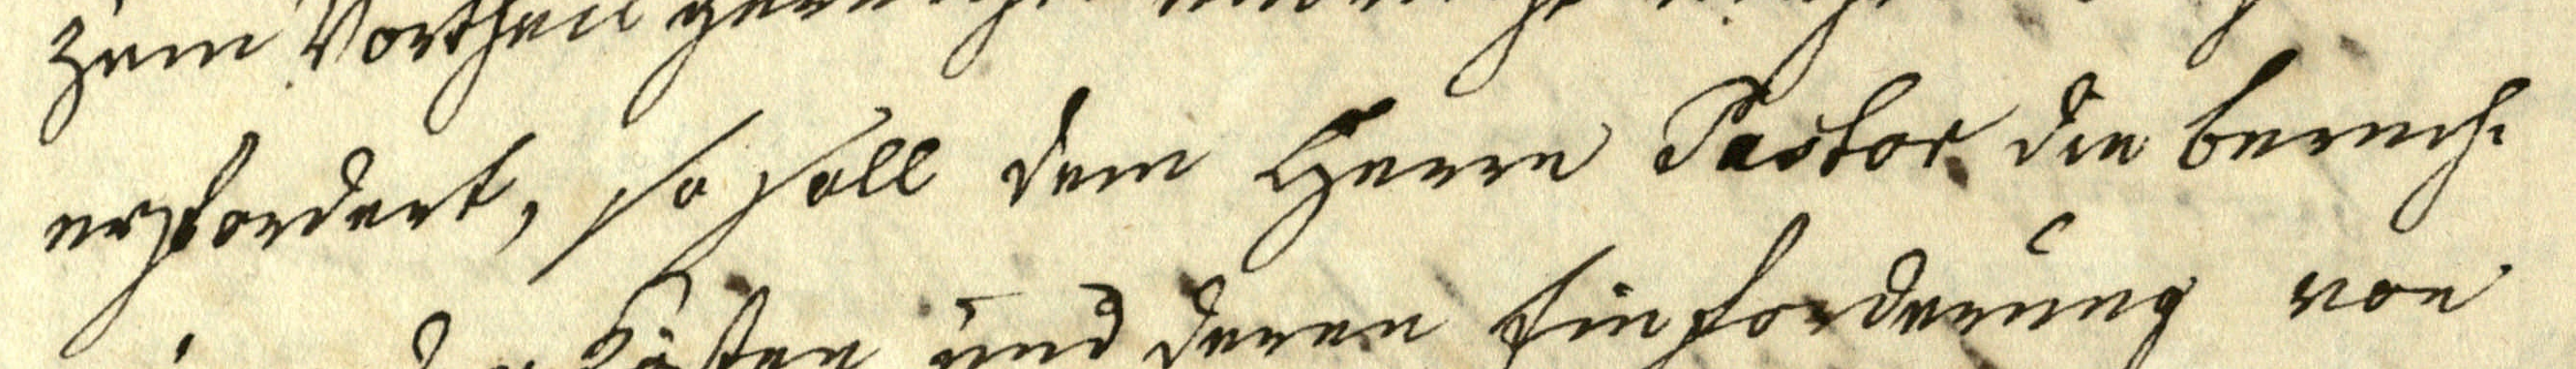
erfordert, so soll dem Herrn Pastor die Berech¬
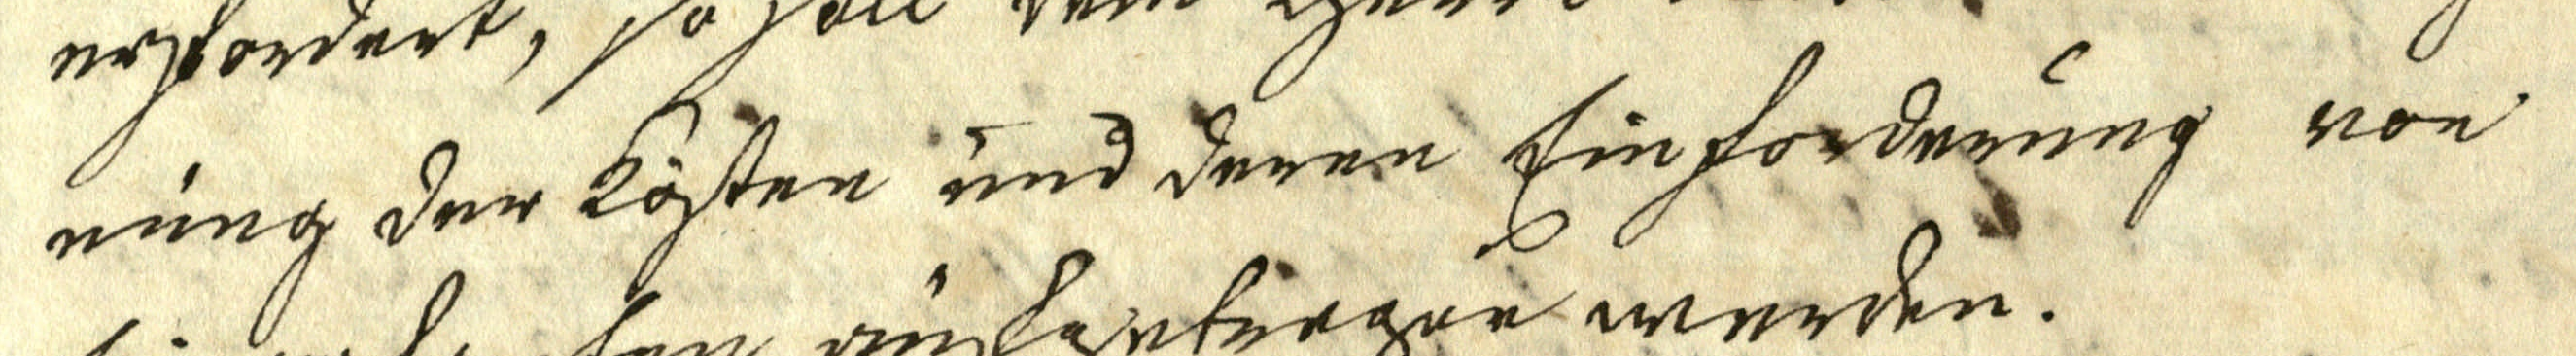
nung der Kosten und deren Einforderung von
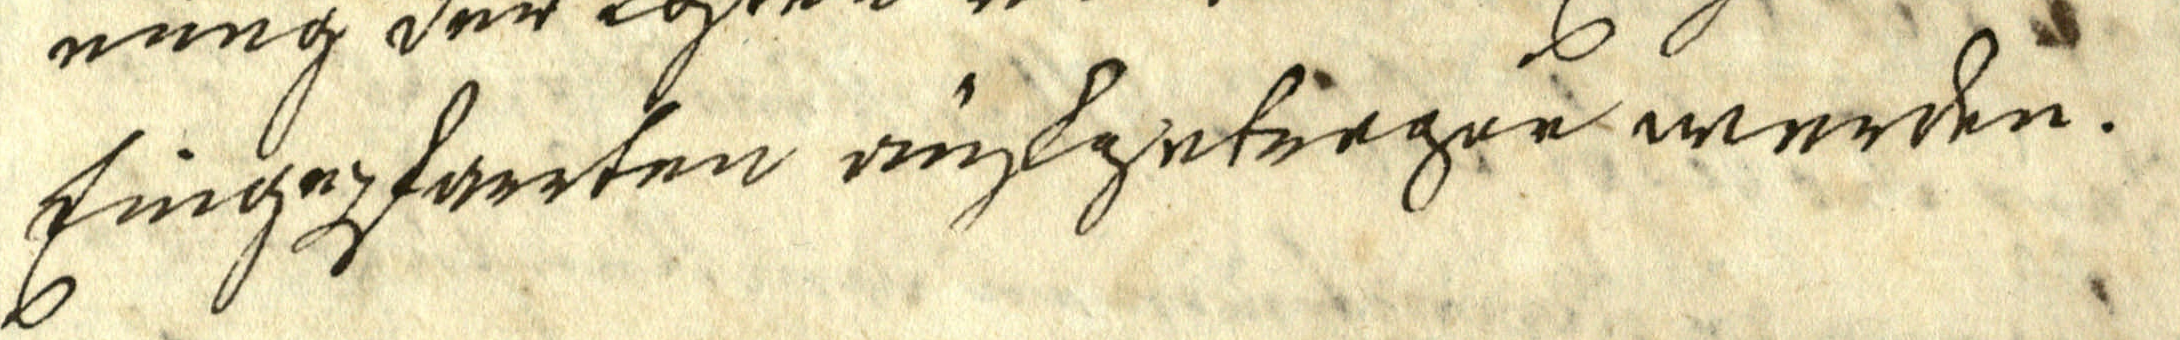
Eingepfarrten aufgetragen werden.
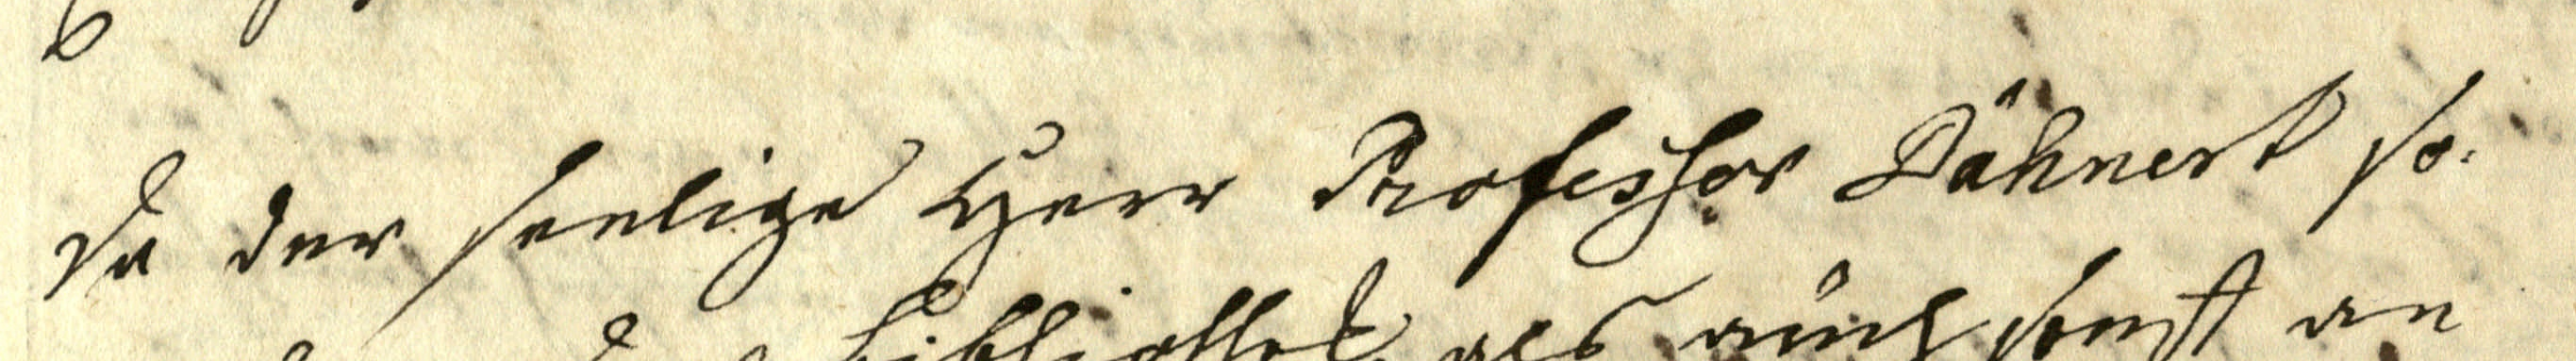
Da der seelige Herr Professor Dähnert so¬
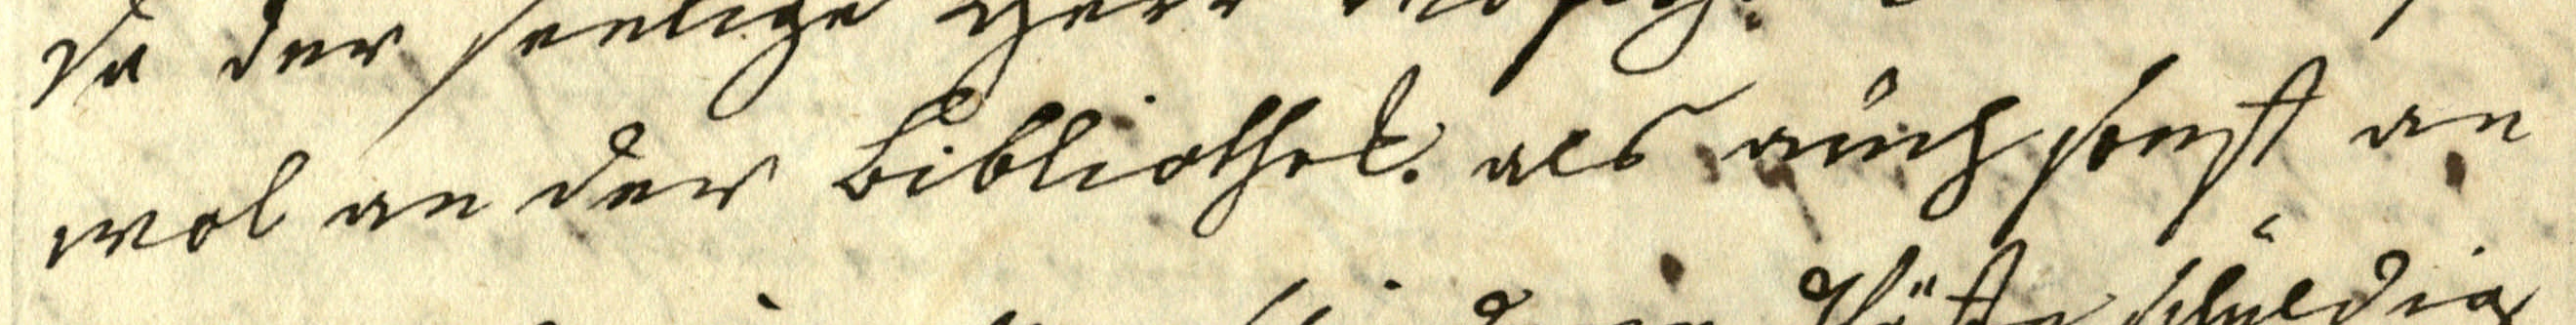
wol an der Bibliothek als auch sonst an
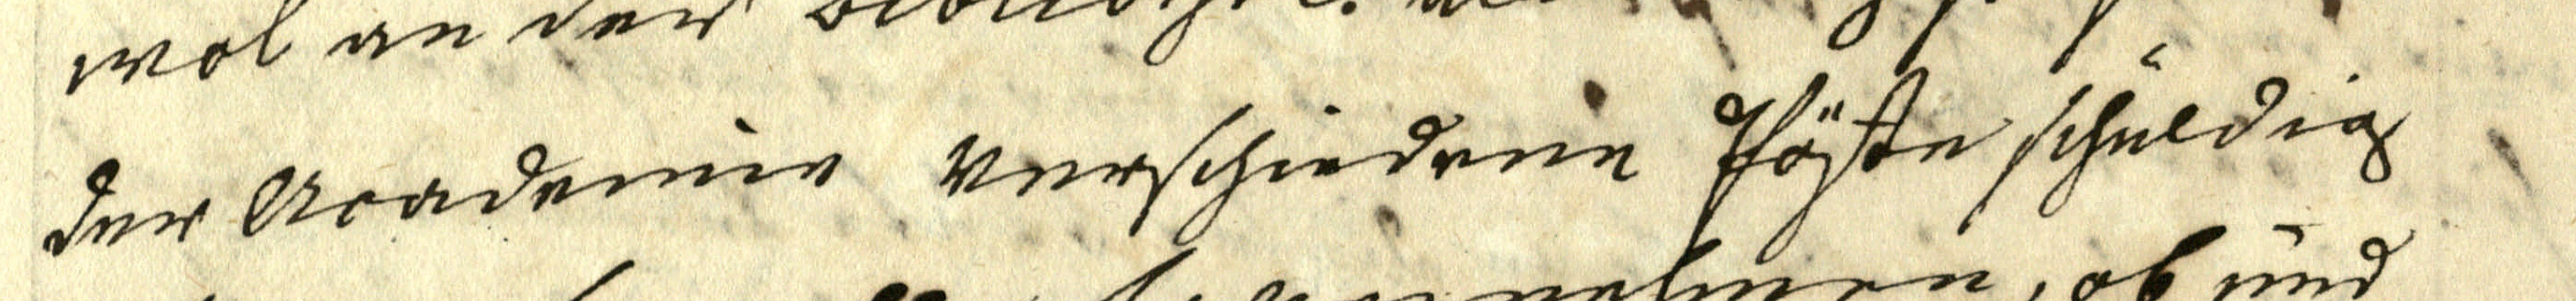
der Academie verschiedene Pöste schuldig
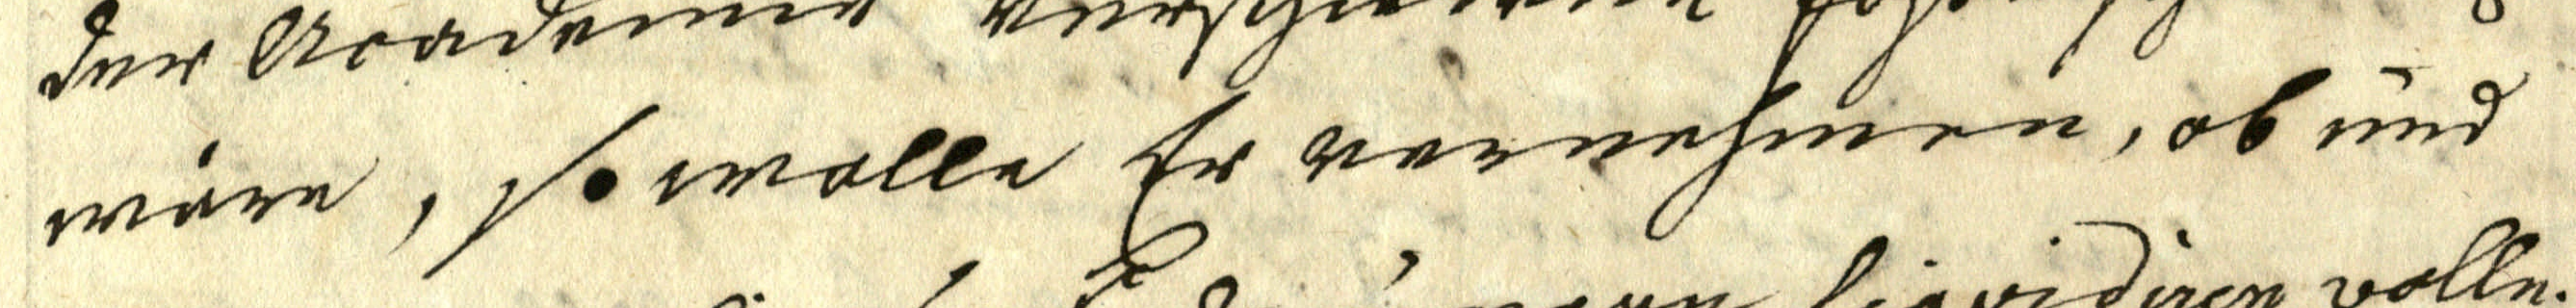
wäre, so wolle Er vernehmen, ob und
